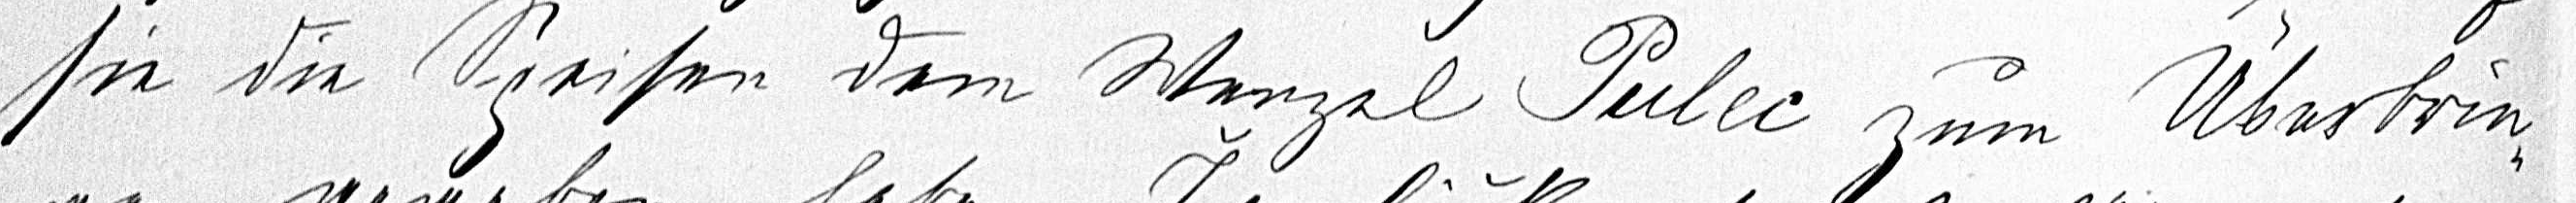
sie die Speisen dem Wenzel Pulec zum Überbrin¬
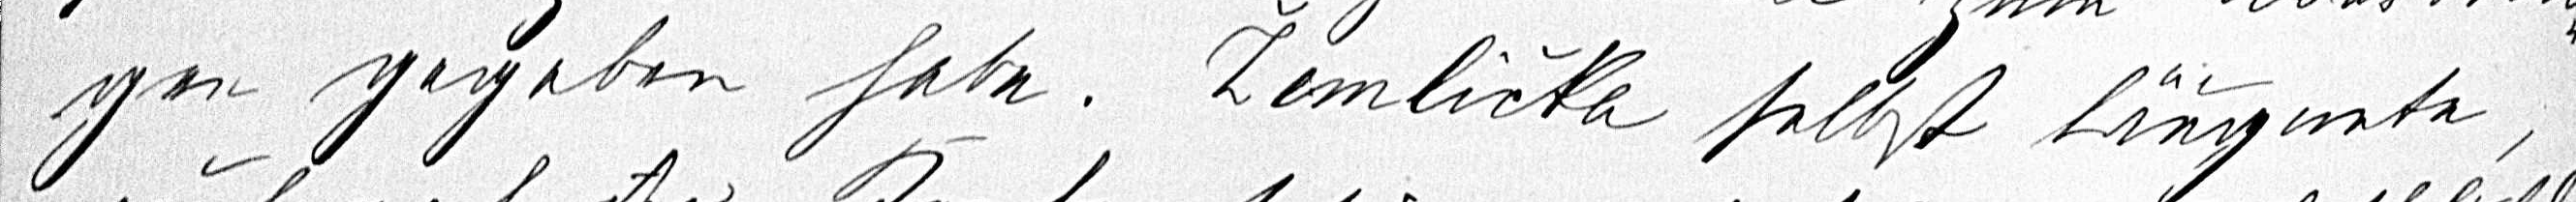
gen gegeben habe. Žemlička selbst läugnete
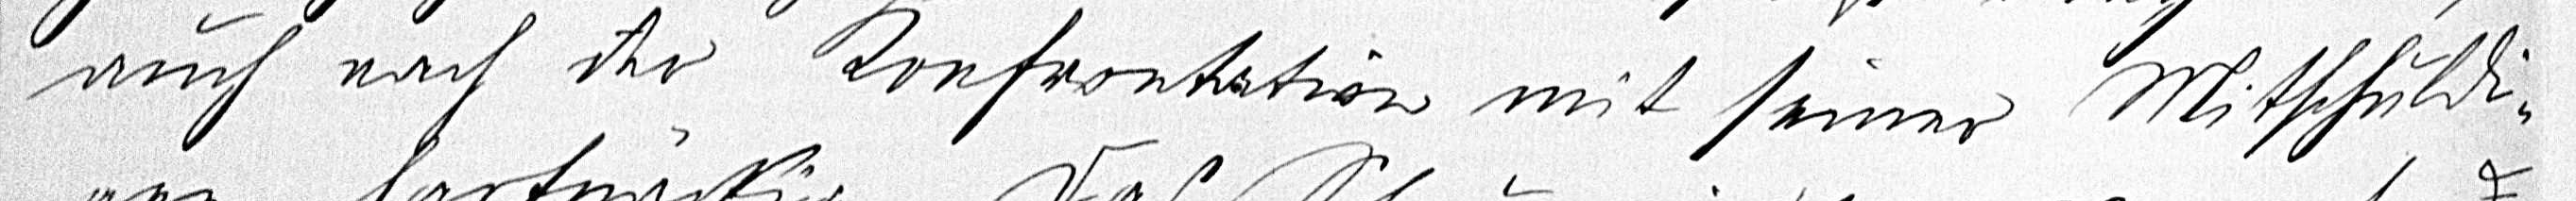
auch nach der Konfrontation mit seiner Mitschuldi¬
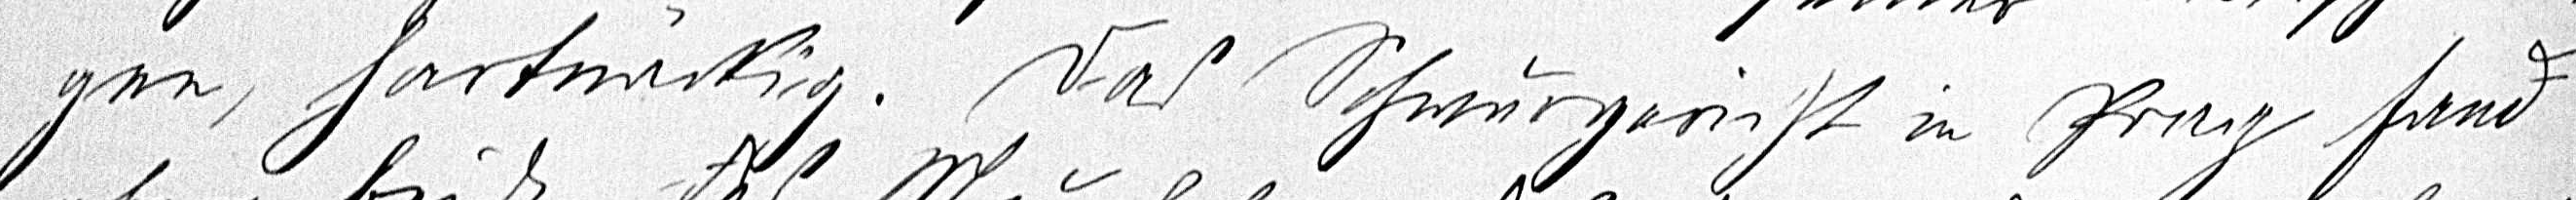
gen, hartnäckig. Das Schwurgericht in Prag fand
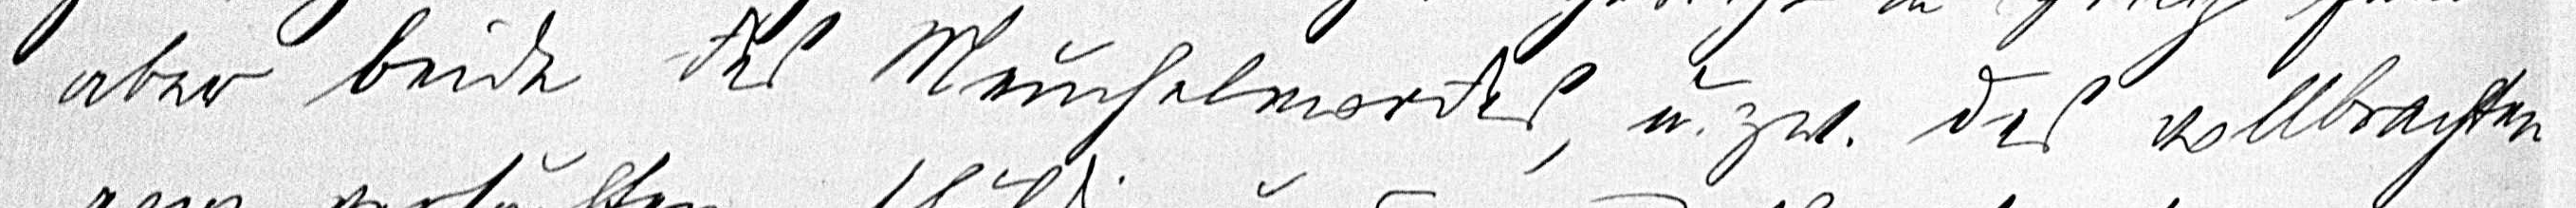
aber beide des Meuchelmordes, u. zw. des vollbrachten
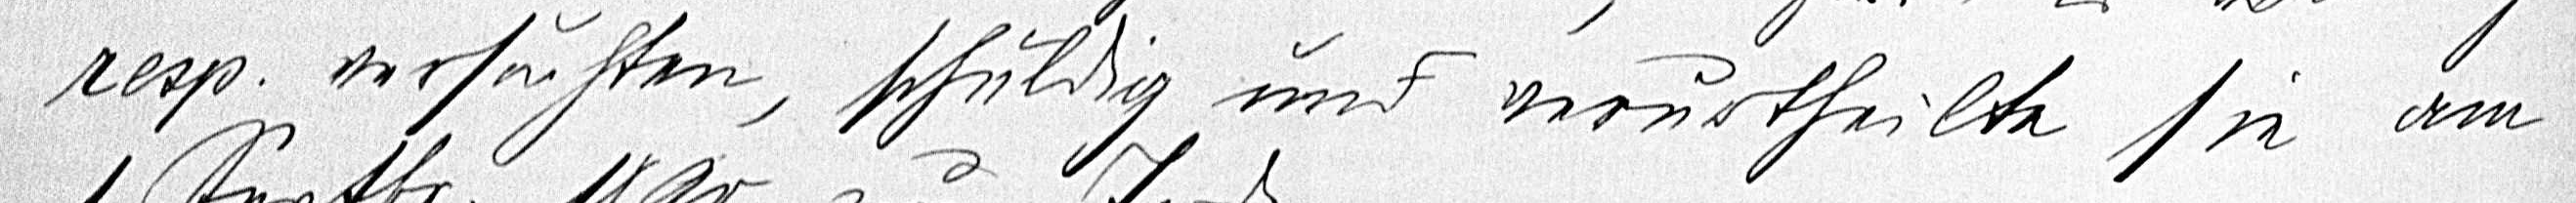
resp. versuchten, schuldig und verurtheilte sie am
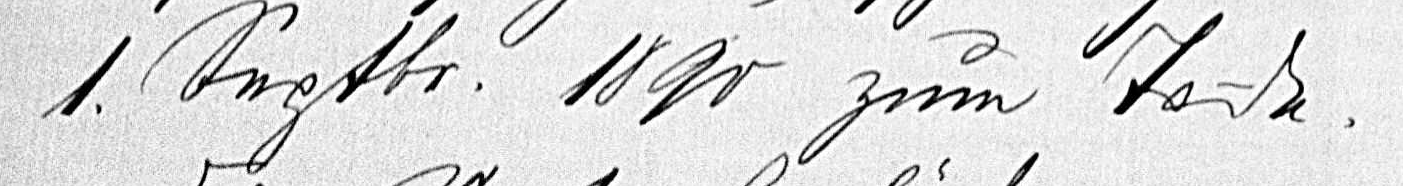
1. Septbr. 1890 zum Tode.
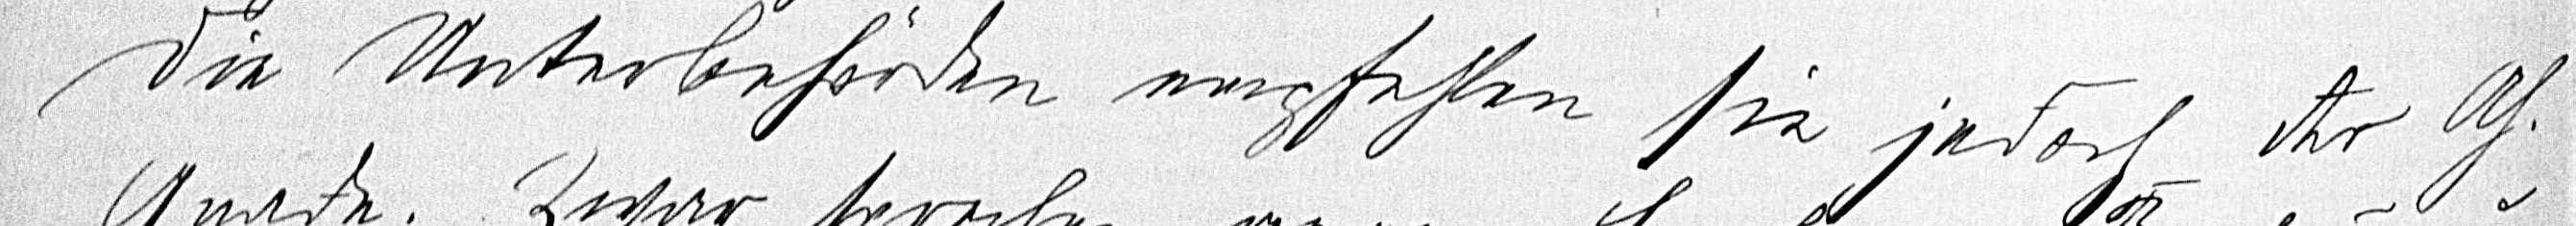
Die Unterbehörden empfehlen sie jedoch der Ah.
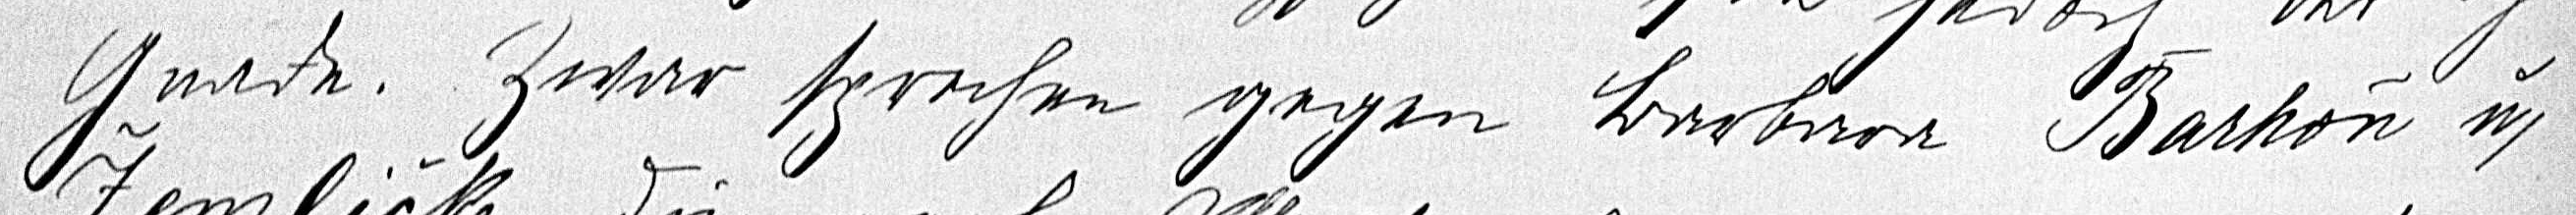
Gnade. Zwar sprechen gegen Barbara Barhxx u/
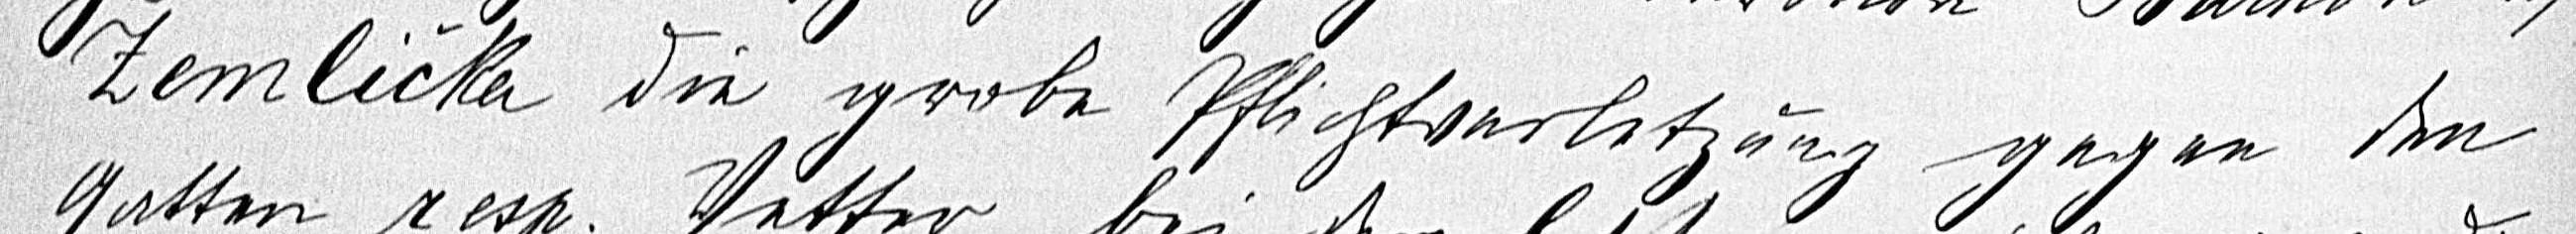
Žemlička die grobe Pflichtverletzung gegen den
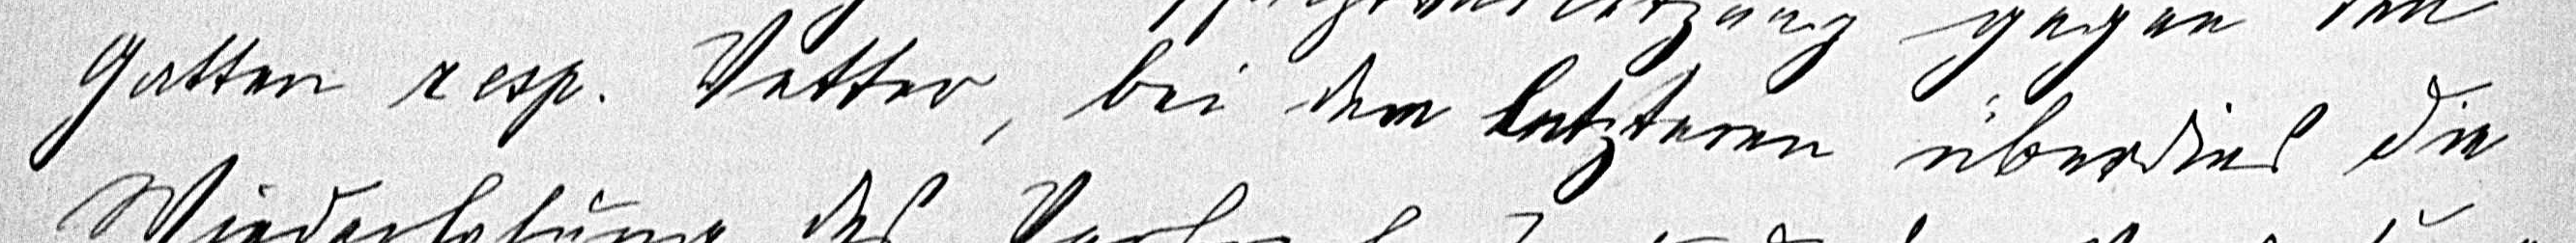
Gatten resp. Vetter, bei den letzteren überdies die
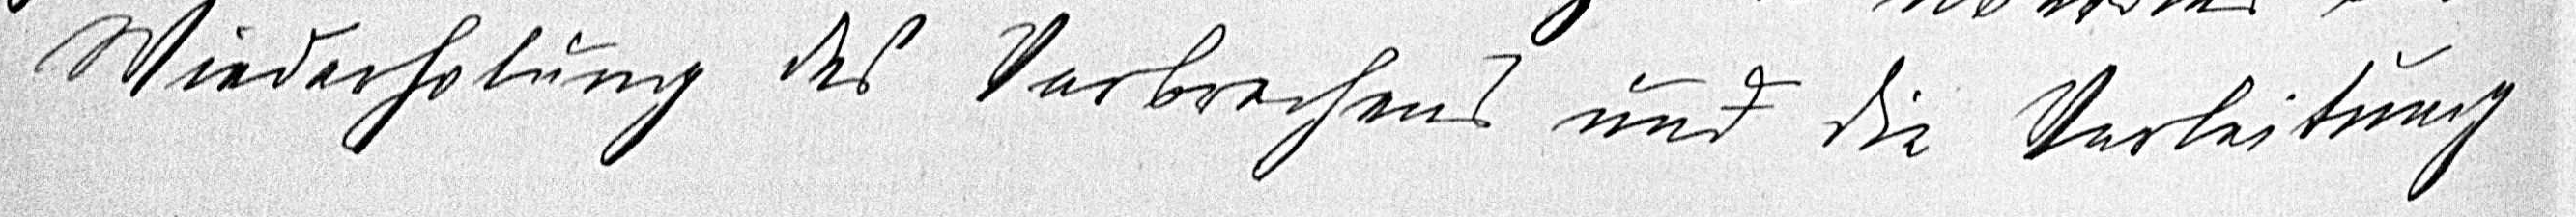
Wiederholung des Verbrechens und die Verleitung
